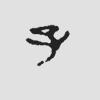子
